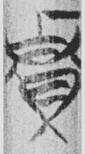貴
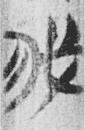我
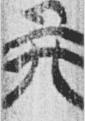而
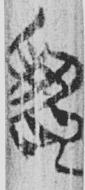受（授）
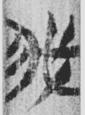我
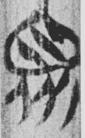衆
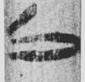㠯（以）
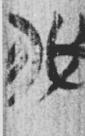我
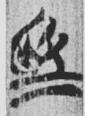爲
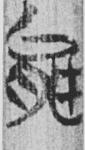能
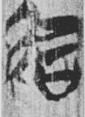○（治）
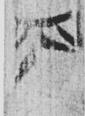今
